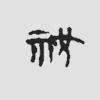祝
